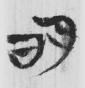明
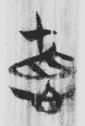惪
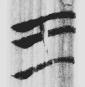王
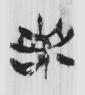若
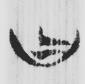曰
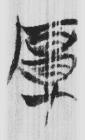厚
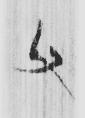父
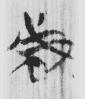{戌虫}
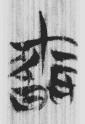{尒䎽}
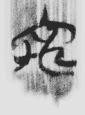禹
